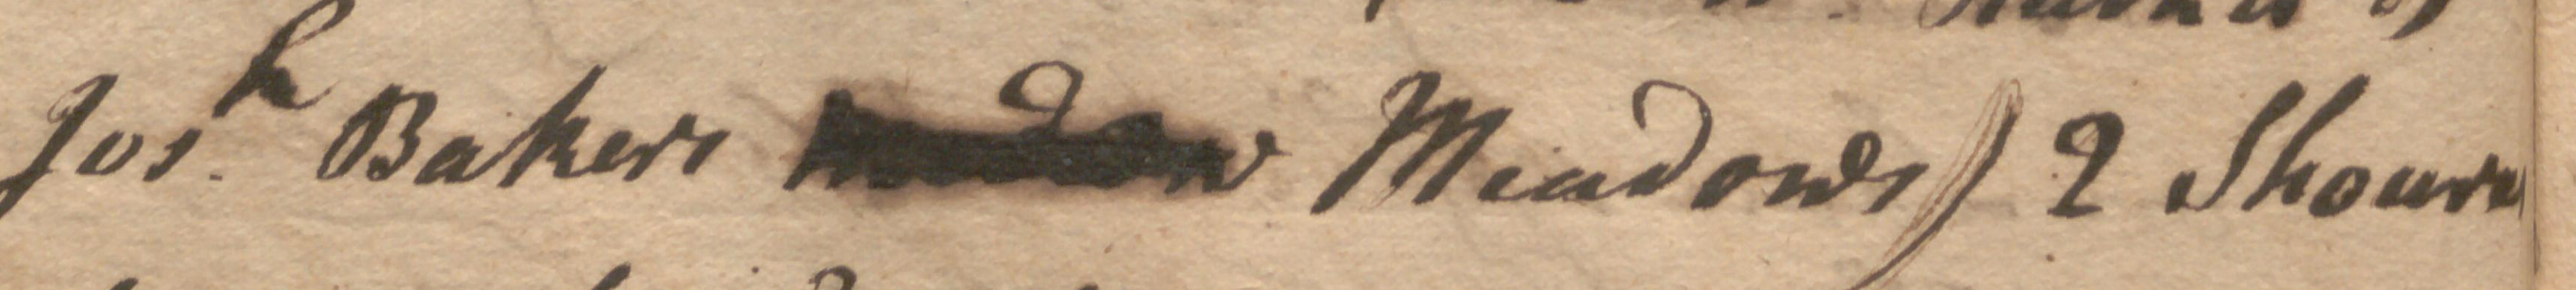Jos^h. Bakers [meadow] Meadows) 2 Shours
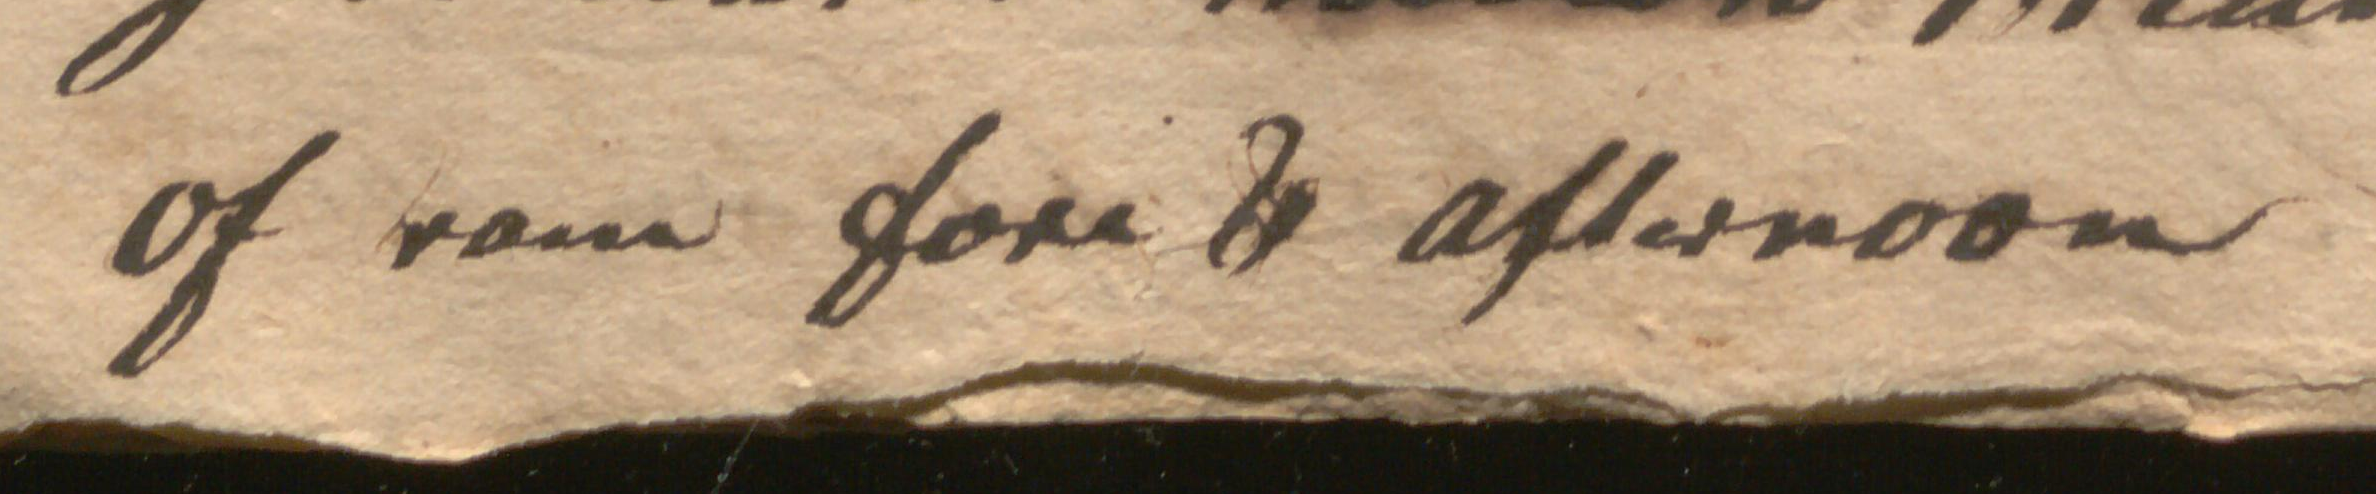of rain fore & afternoon
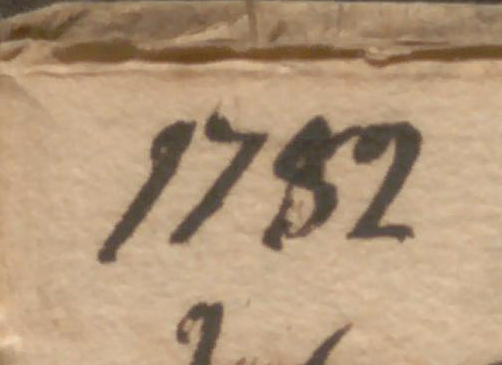1782
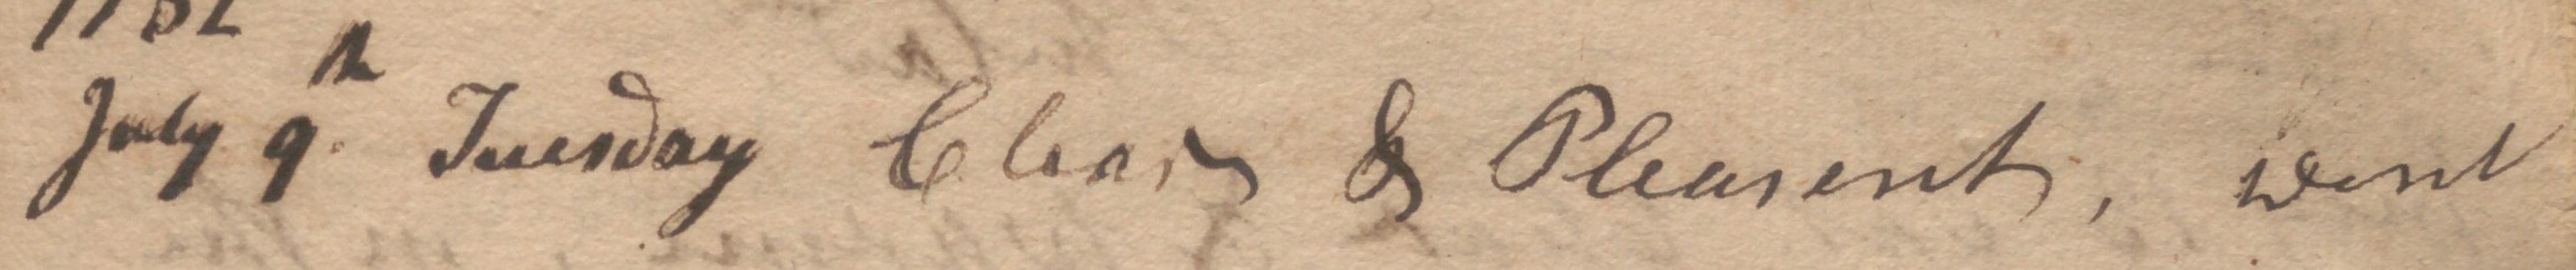July 9^th. Tuesday Clear & Pleasent, went
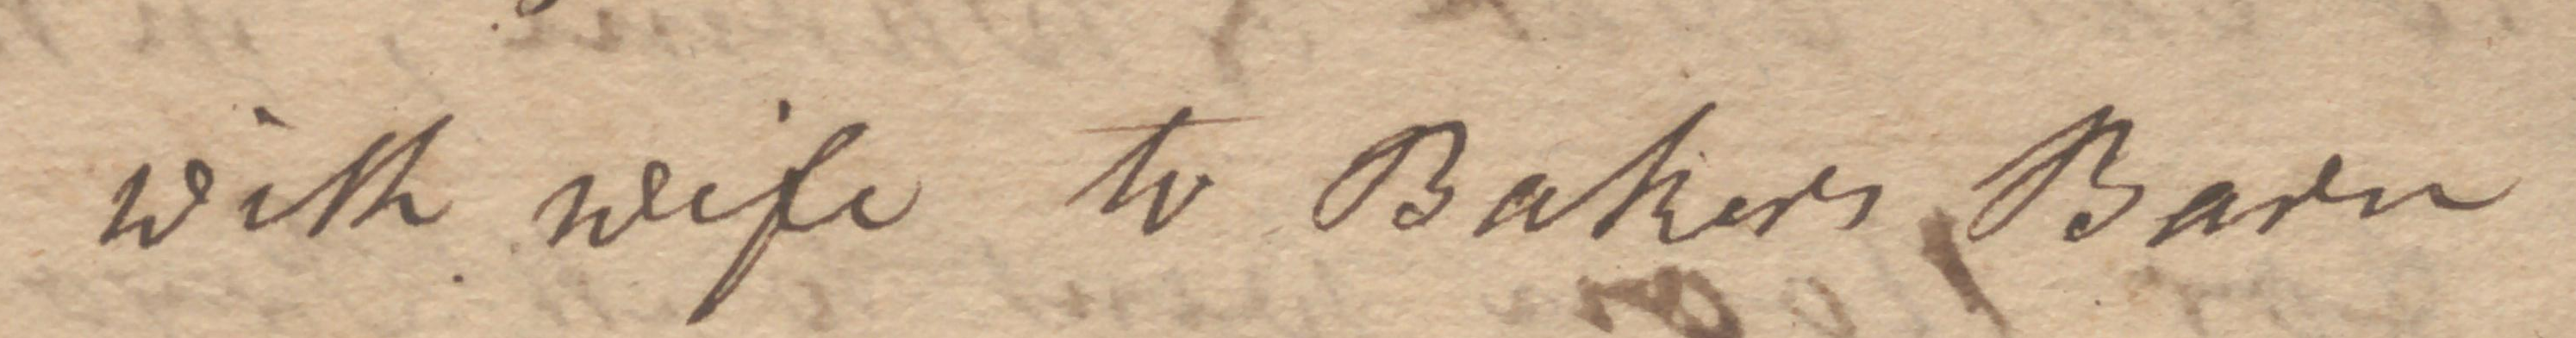with wife to Bakers Barn
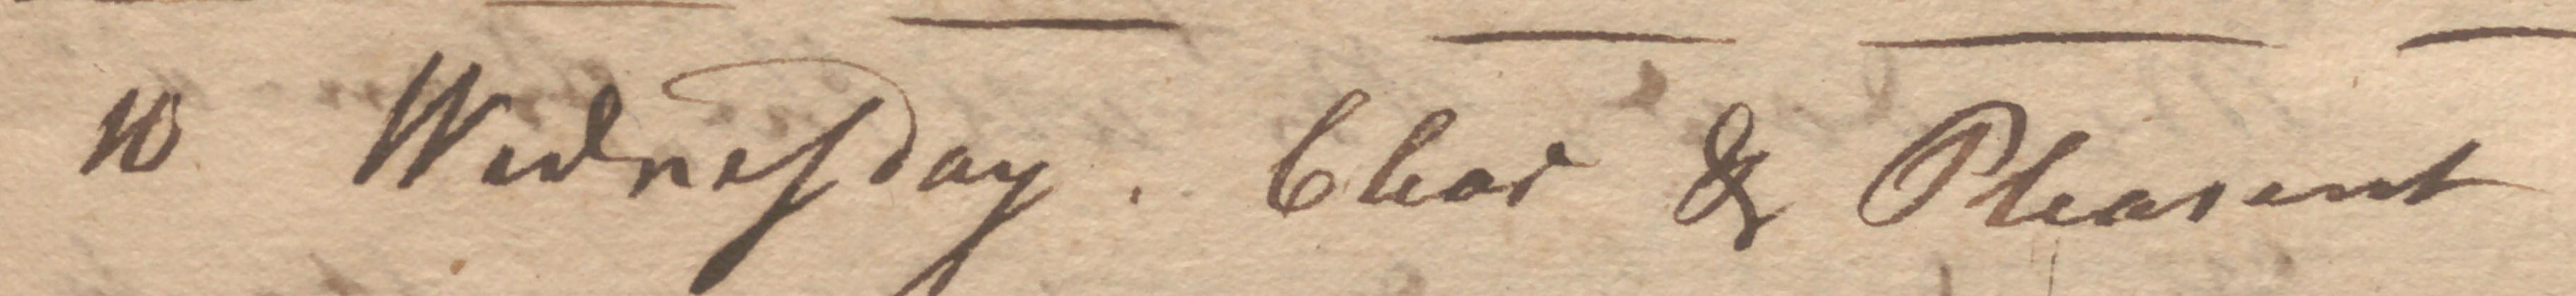10 Wednesday. Clear & Pleasent
